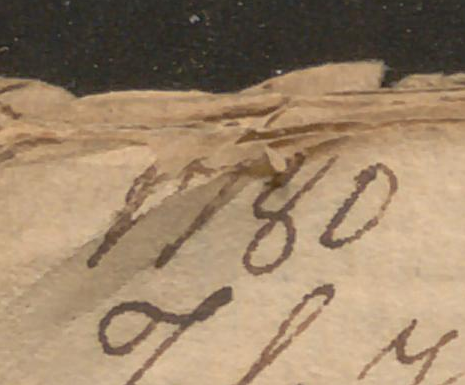1780
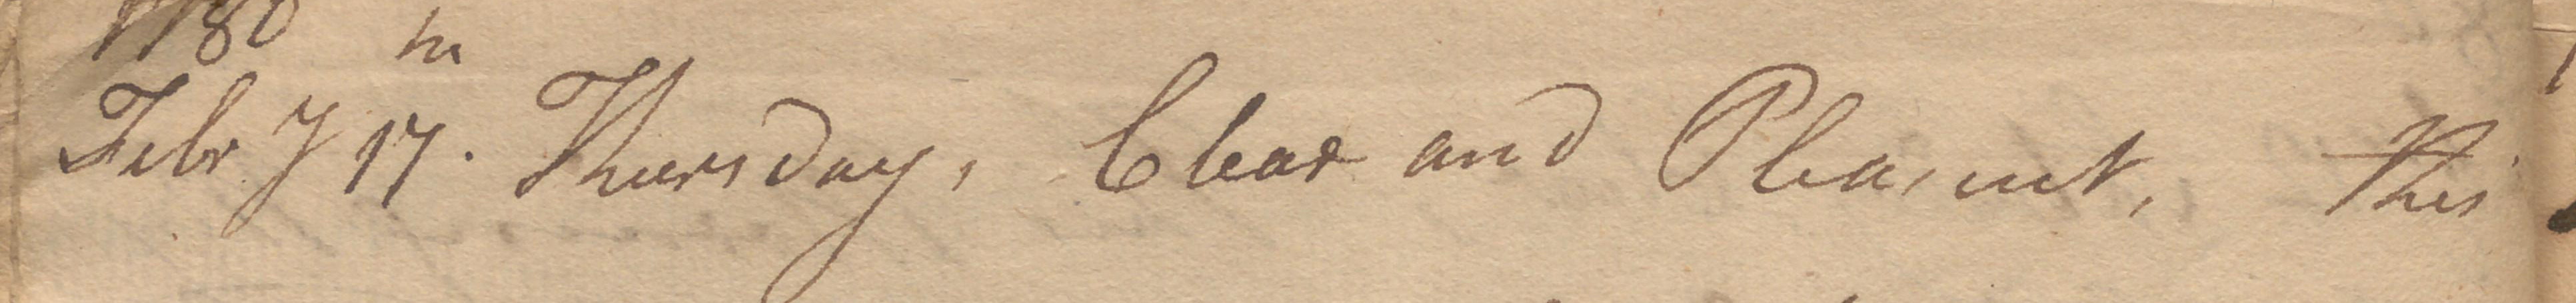Febr^y 17^th. Thursday, Clear and Pleasent, this
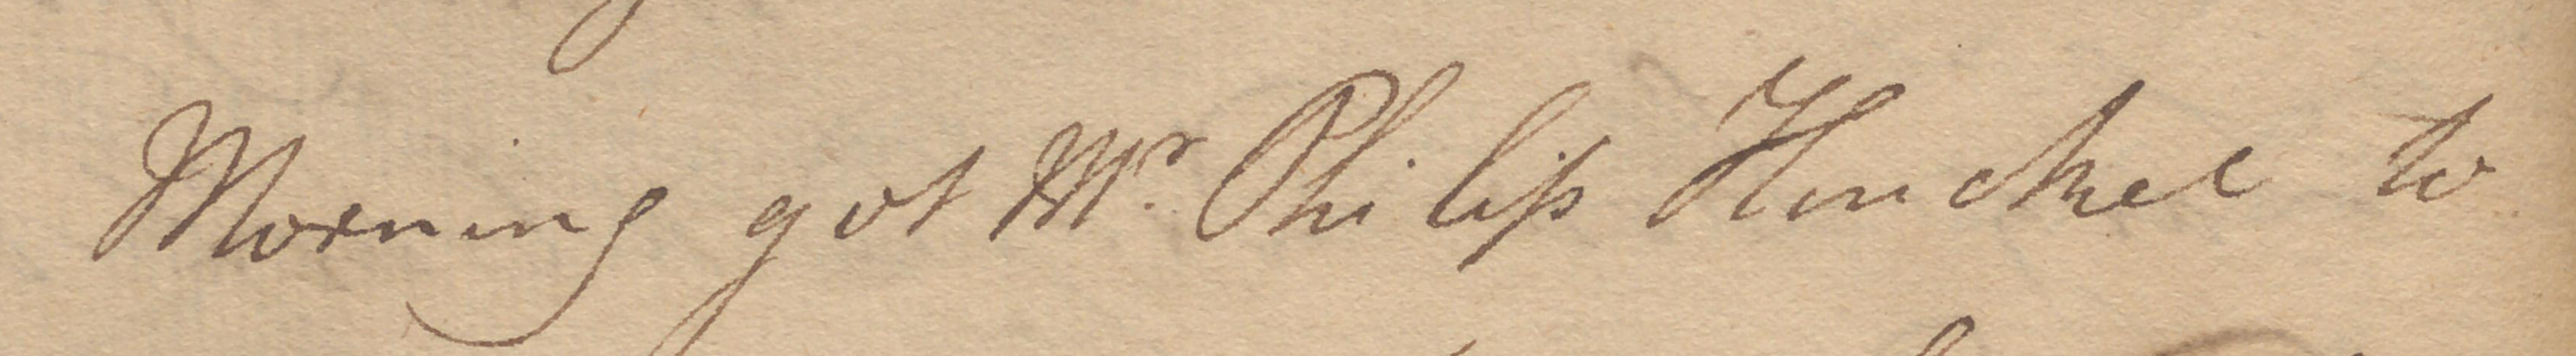Morning got M^r. Philip Henckel to
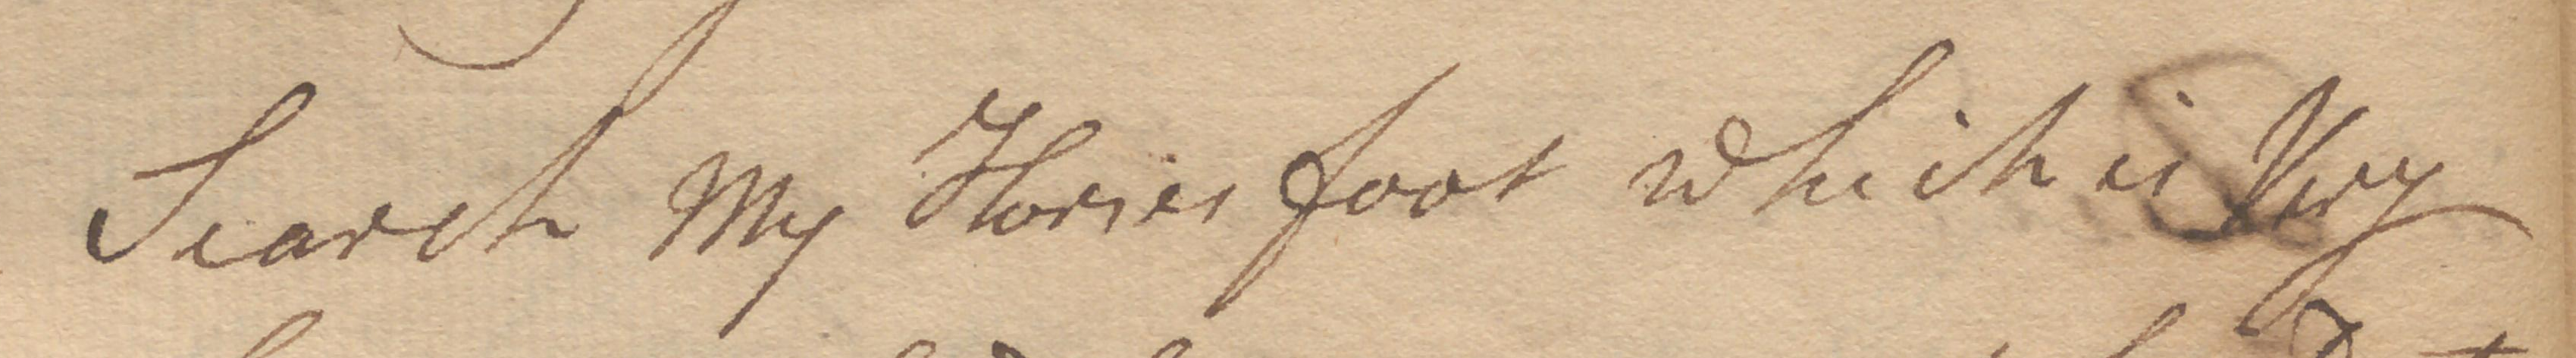search My Horses foot which is Very
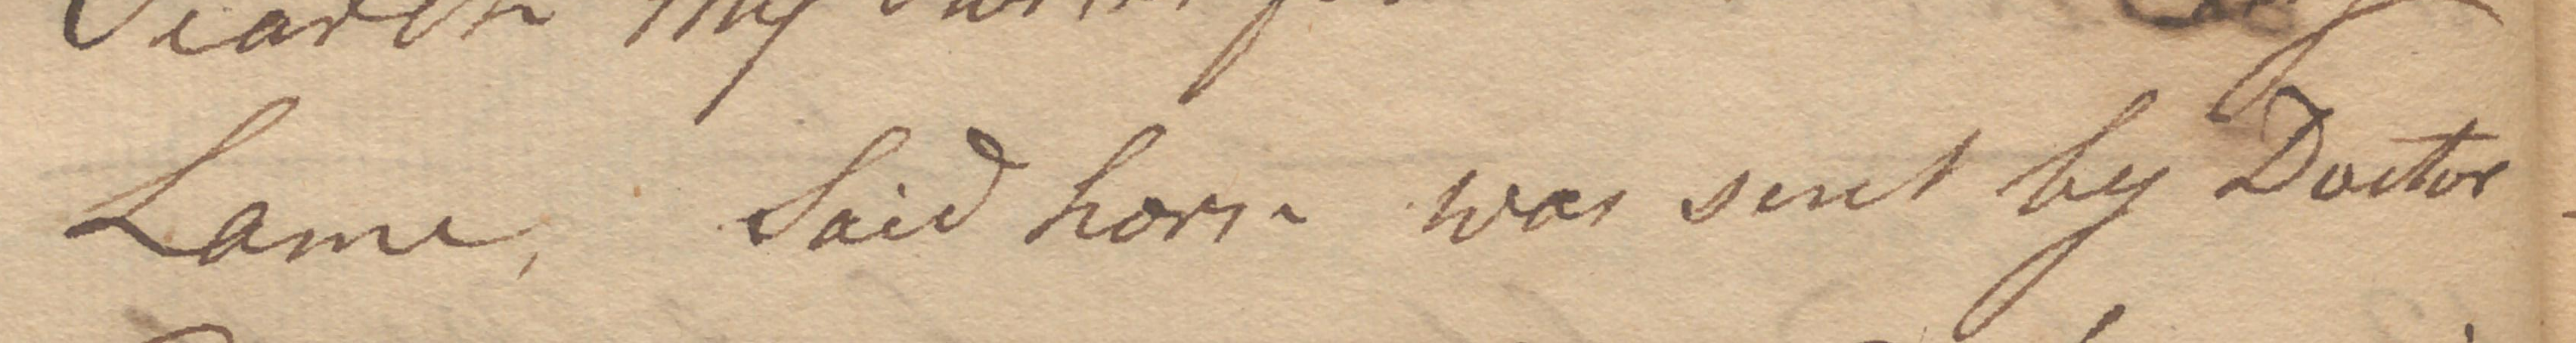Lame, said horse was sent by Doctor
